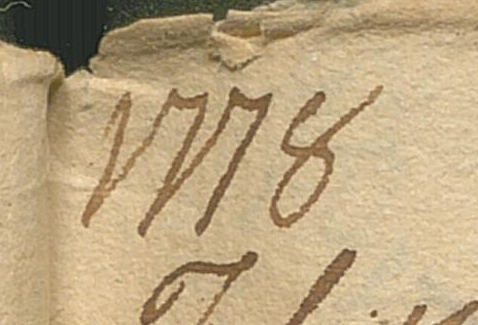1778
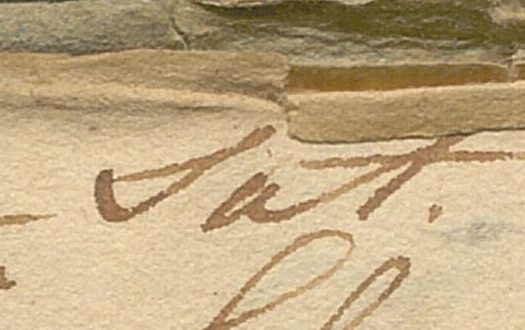Sat.
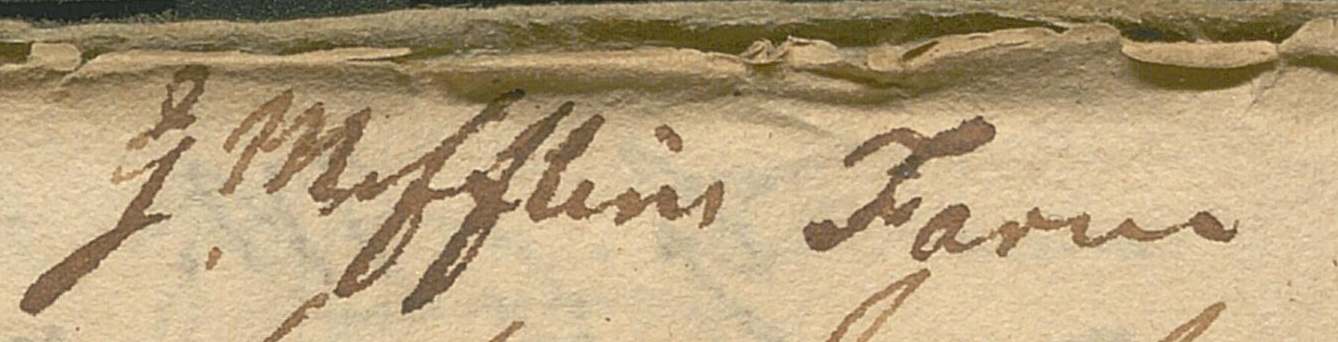G. Mifflins Farm
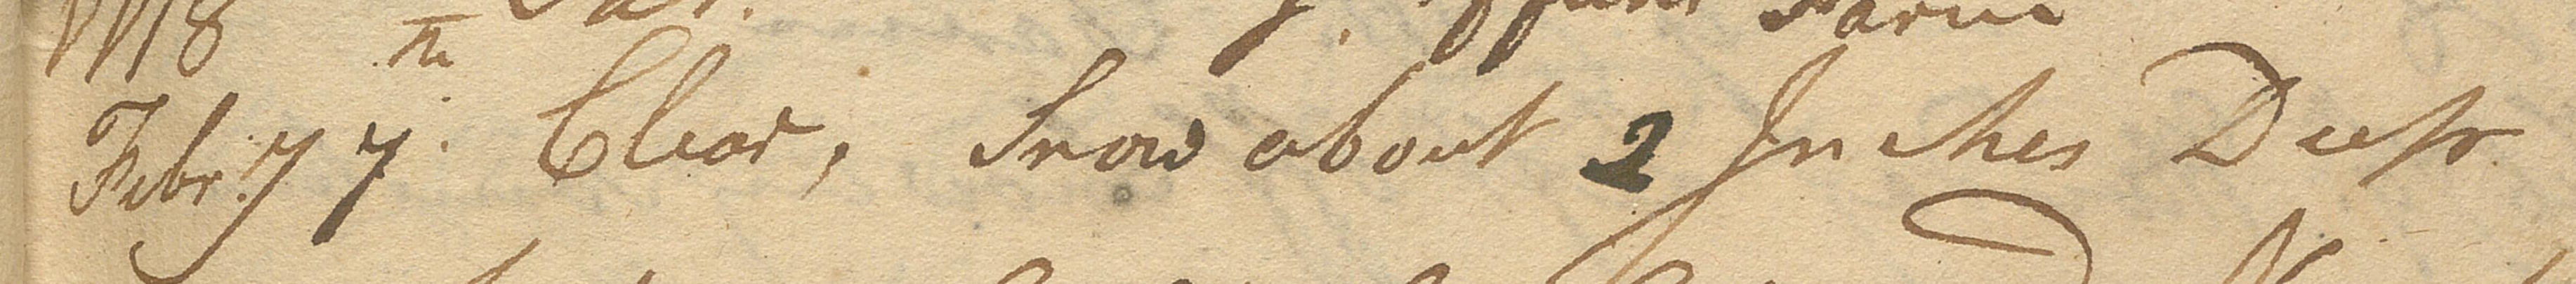Febr^y. 7^th. Clear, Snow about 2 Inches Deep
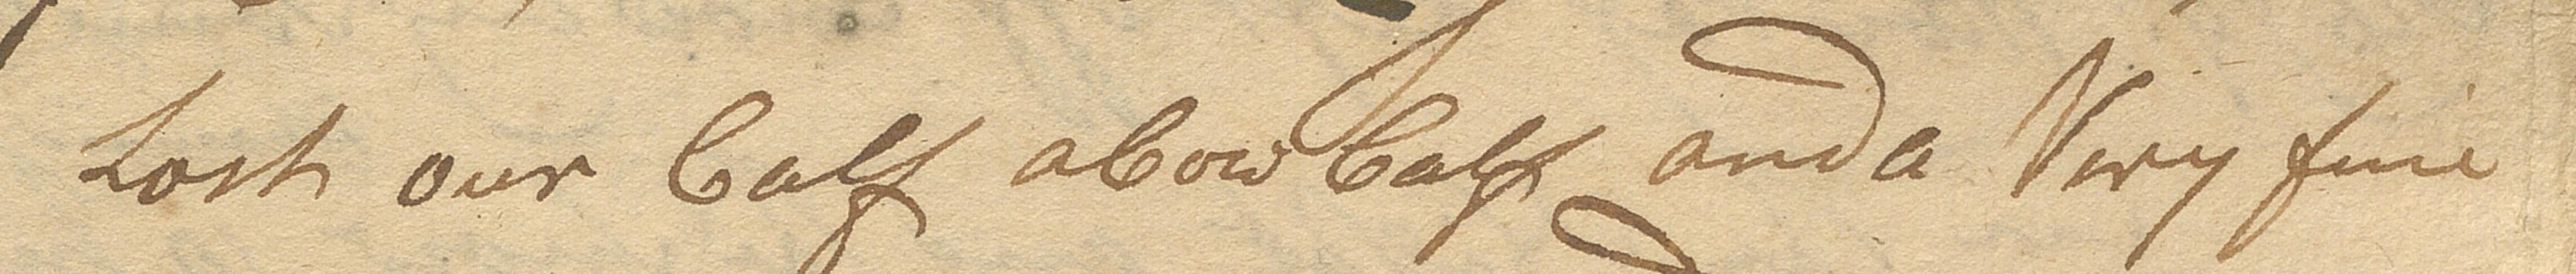Lost our Calf a Cow Calf and a Very fine
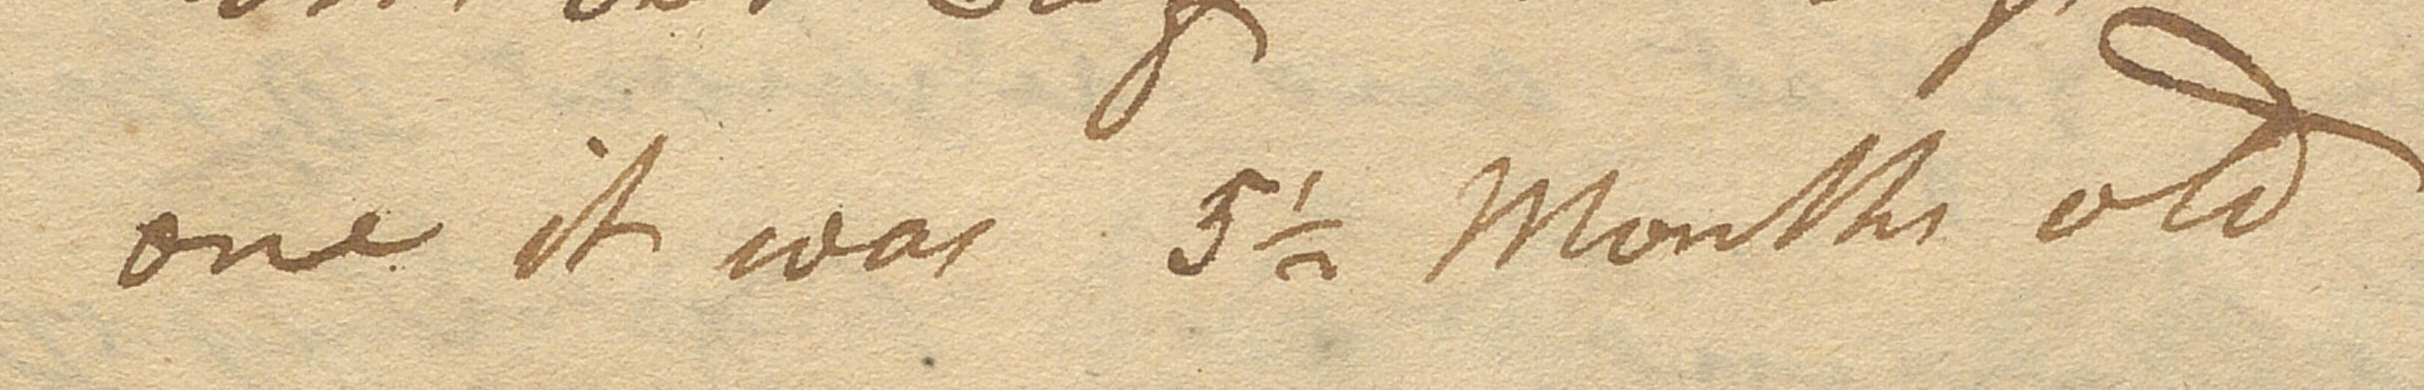one it was 5 1/2 Months old
